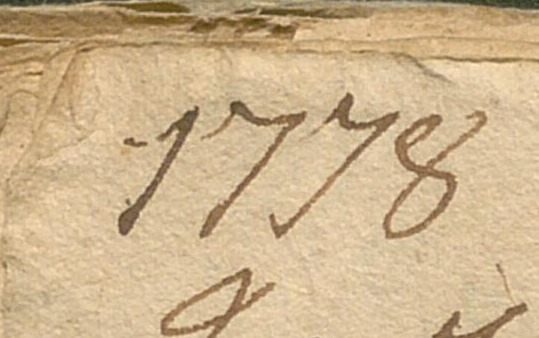1778
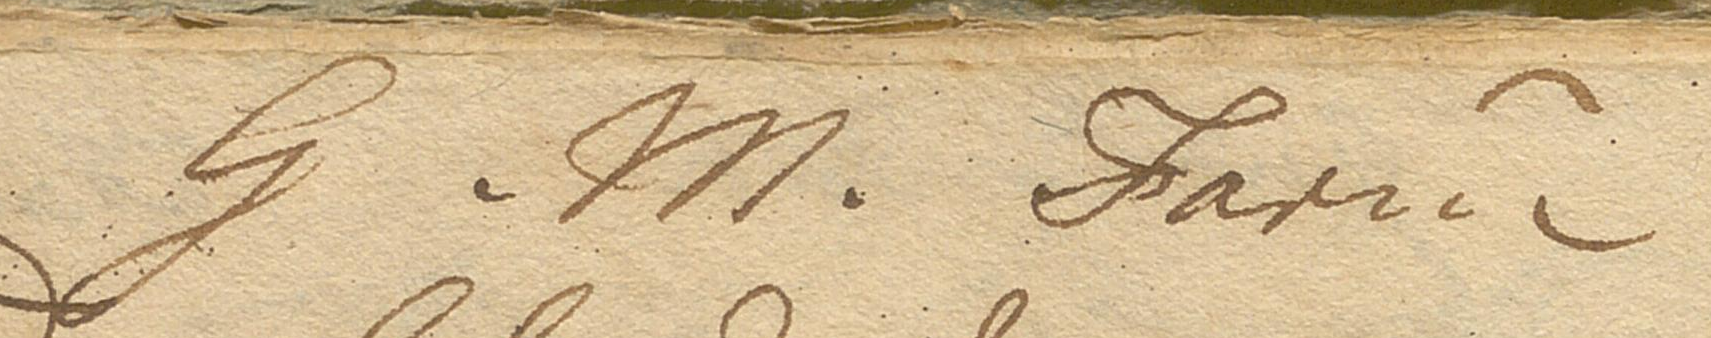G. M. Farm
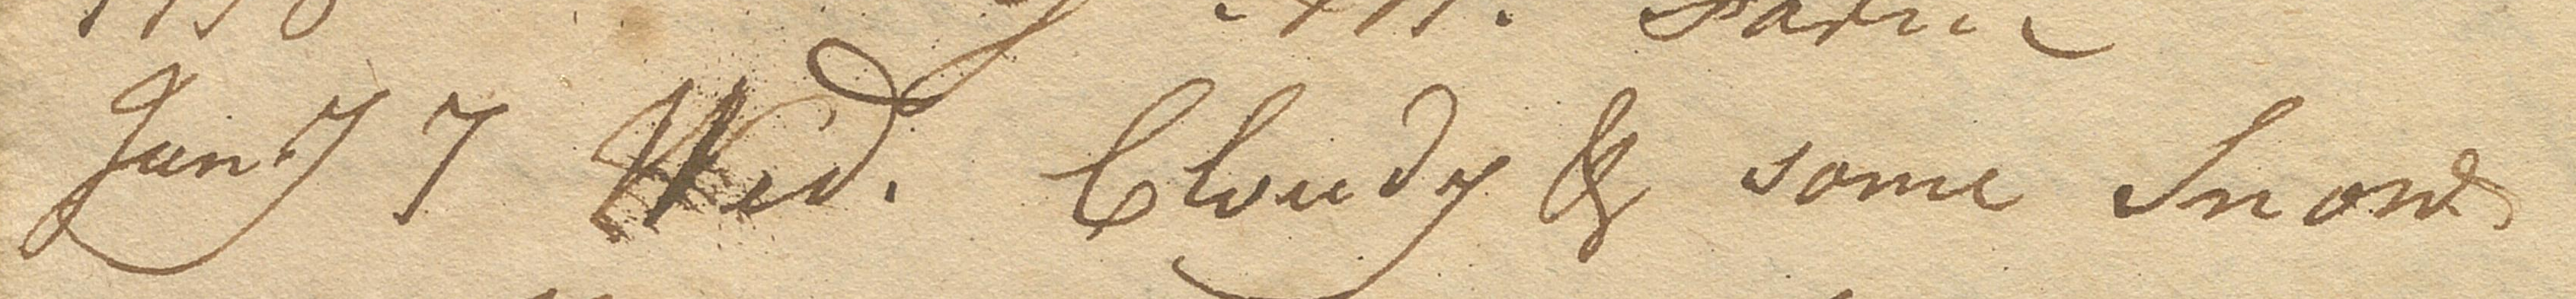Jan^y 7 Wed. Cloudy & some Snow.
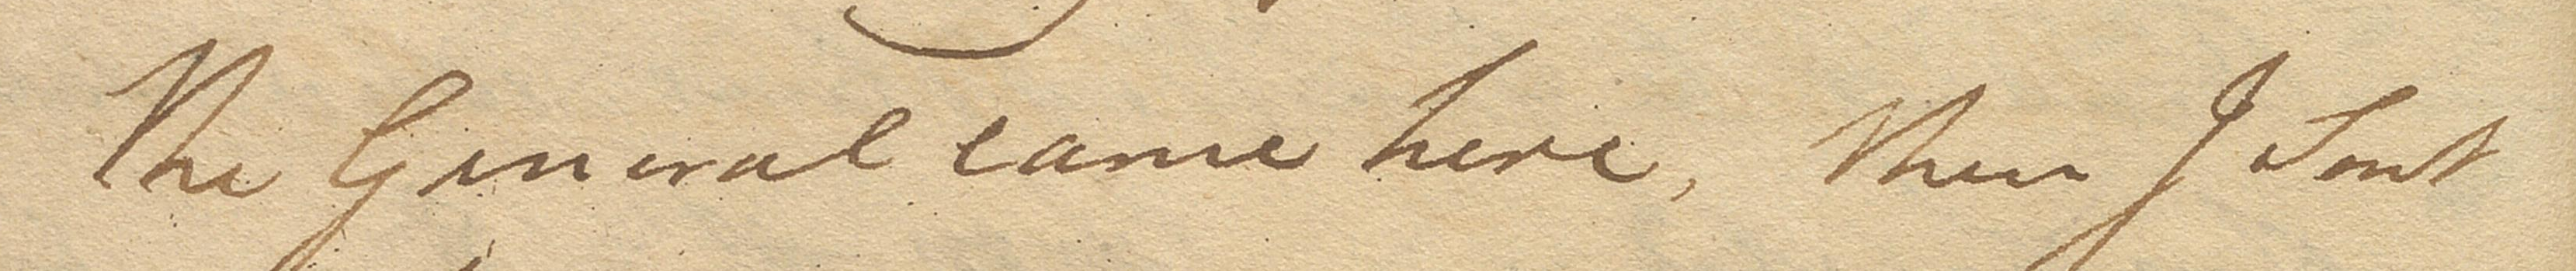The General came here, then I sent
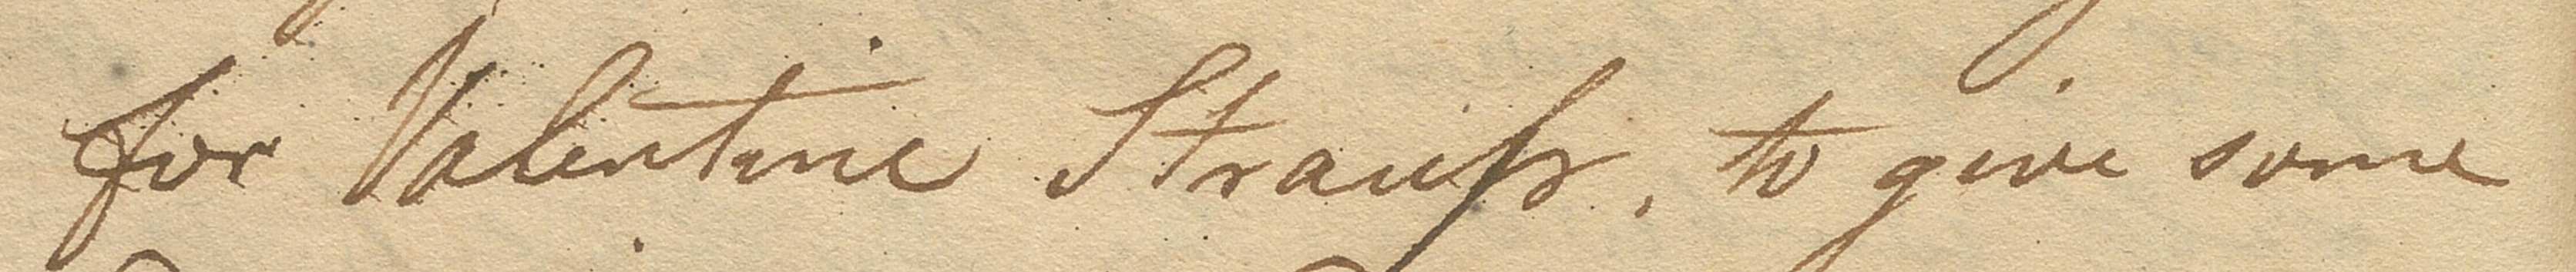for Valentine Straup to give some
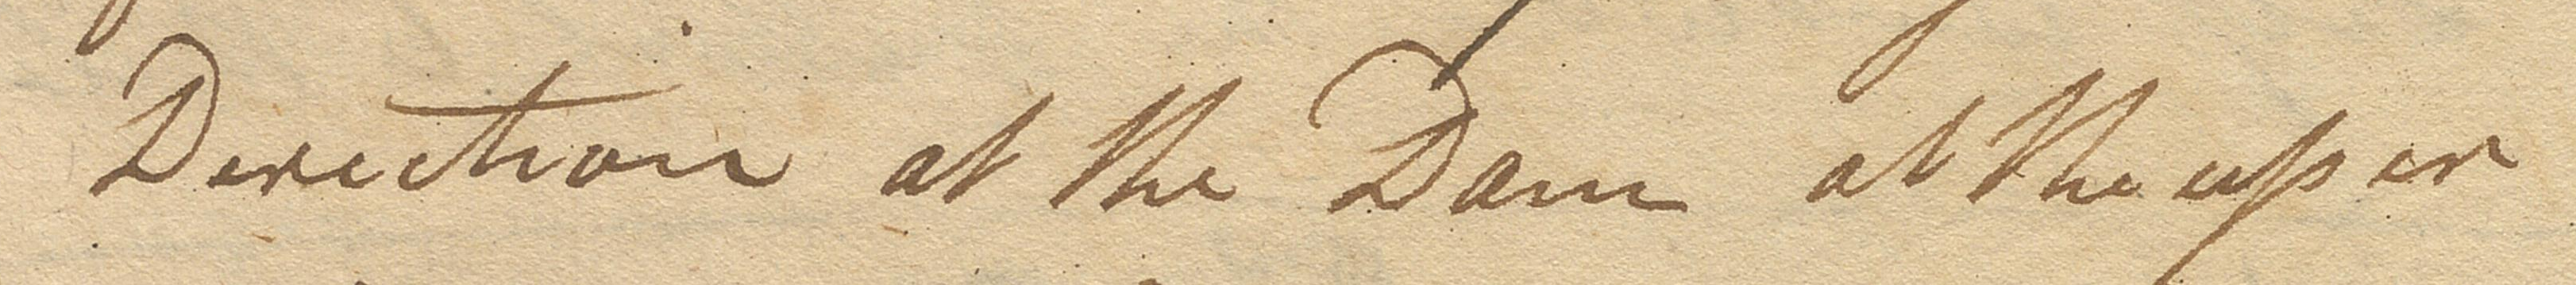Direction at the Dam at the uper
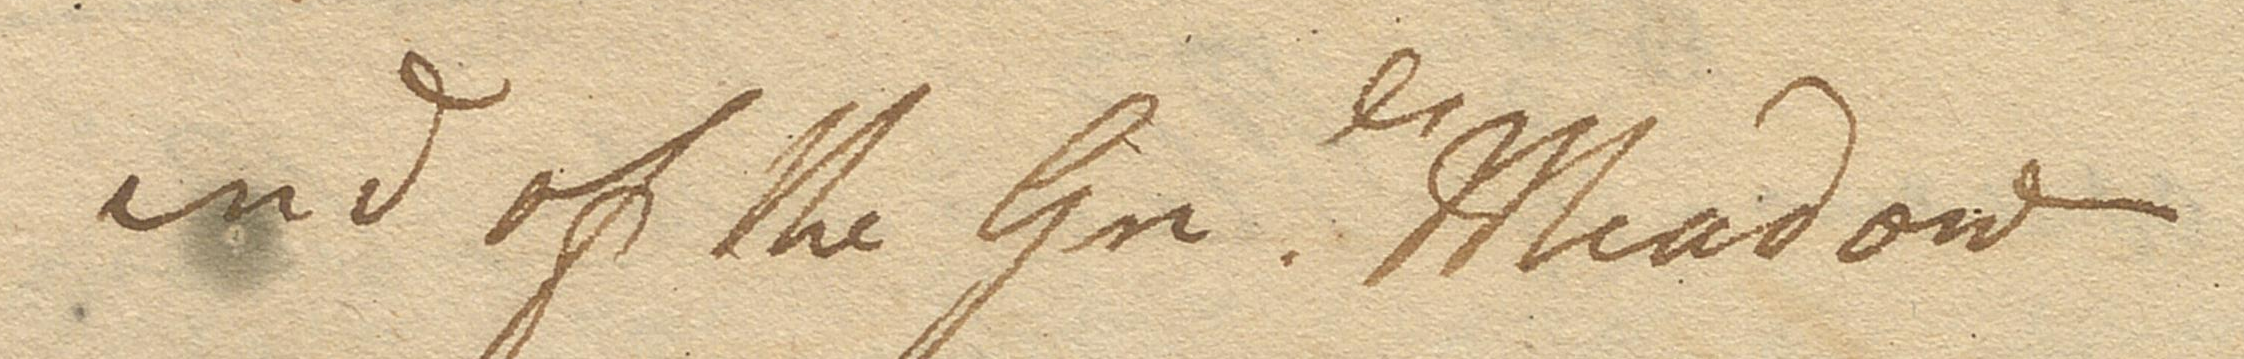ind of the Gn^l. Meadow
